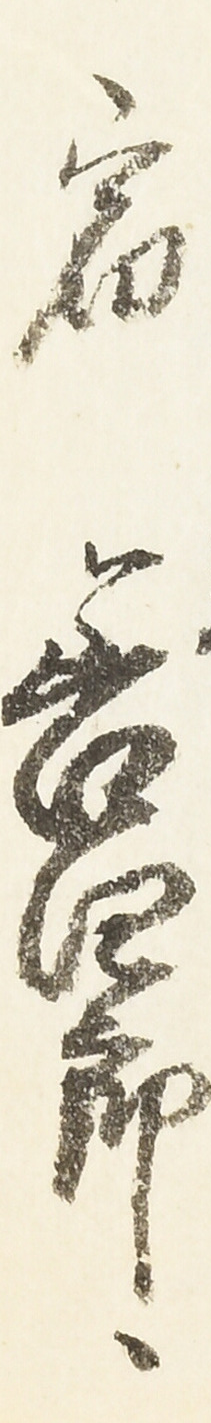宿善四郎・
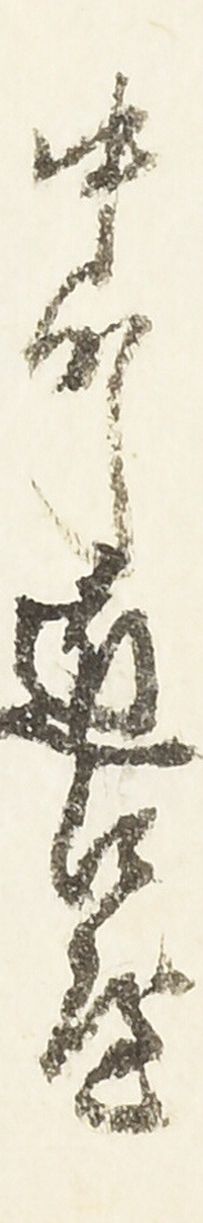中町近江屋
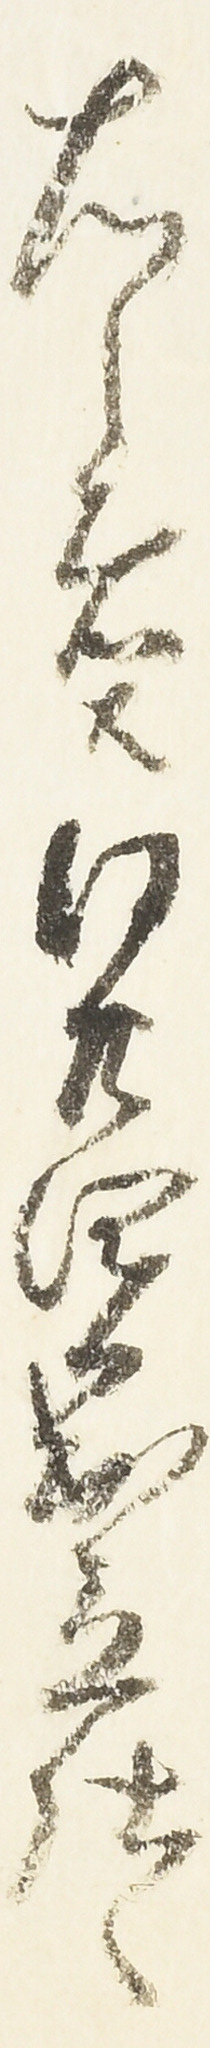右之者共同廿四日出立仕候
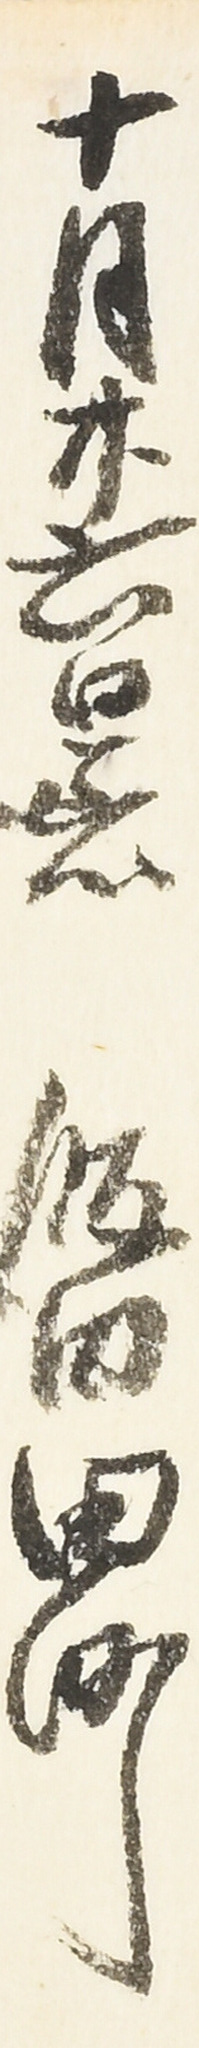十月廿六日着飯田田町
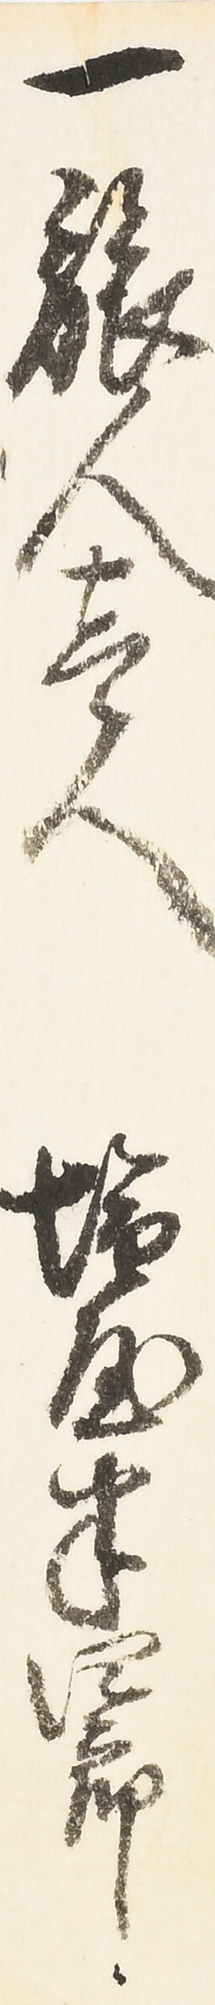一旅人壱人塩屋半四郎・
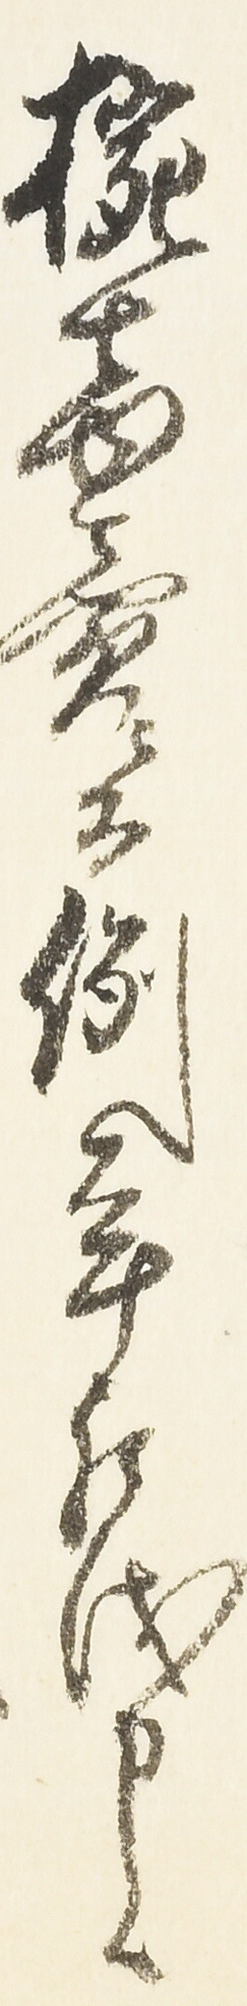椀商売ニ而例年罷越申候
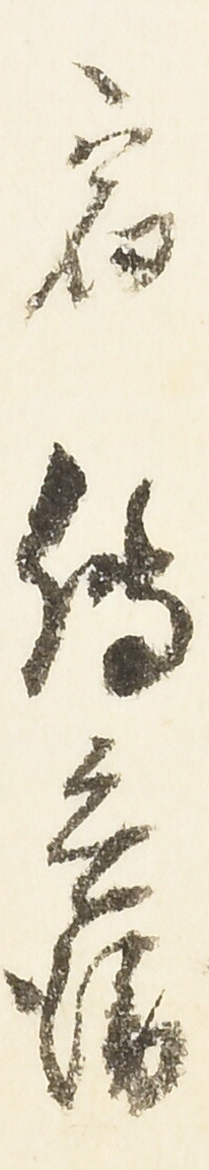宿伝兵衛
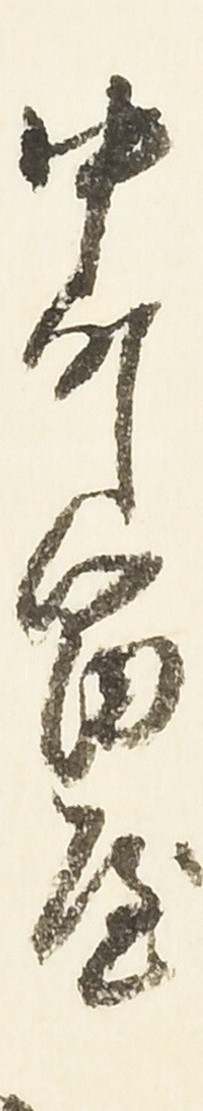中町冨屋
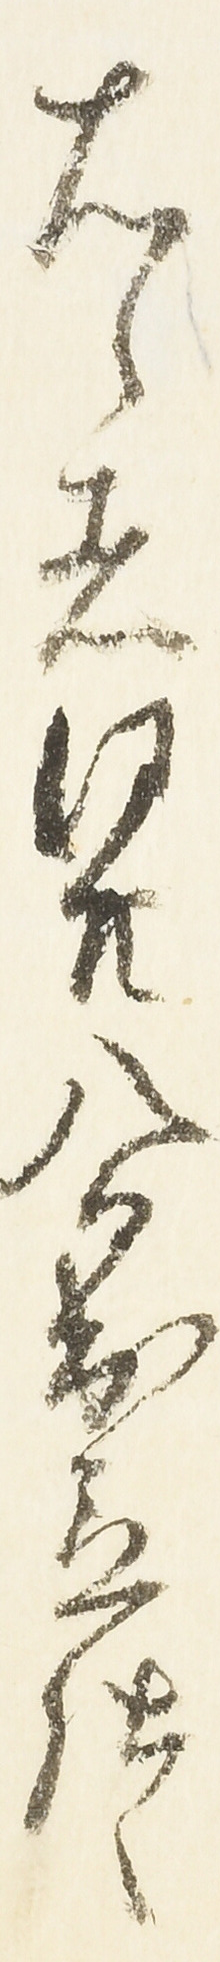右之者同廿八日出立仕候
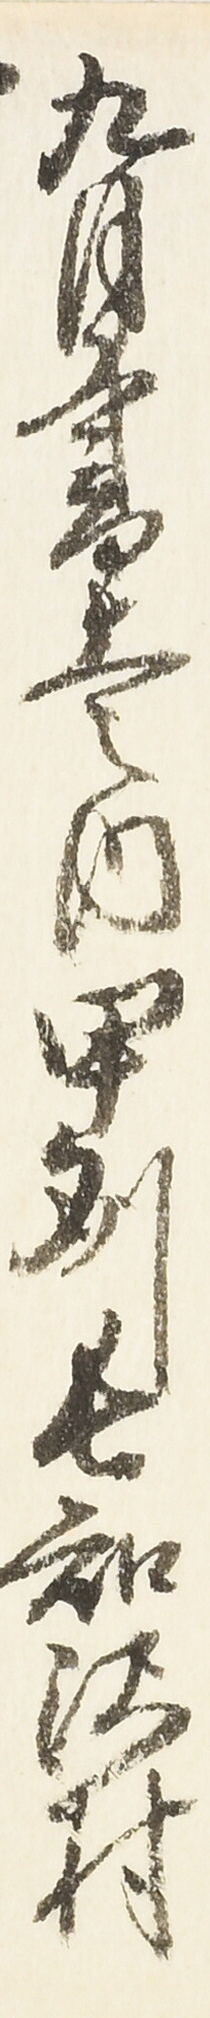九月書上之内甲州長知沢村
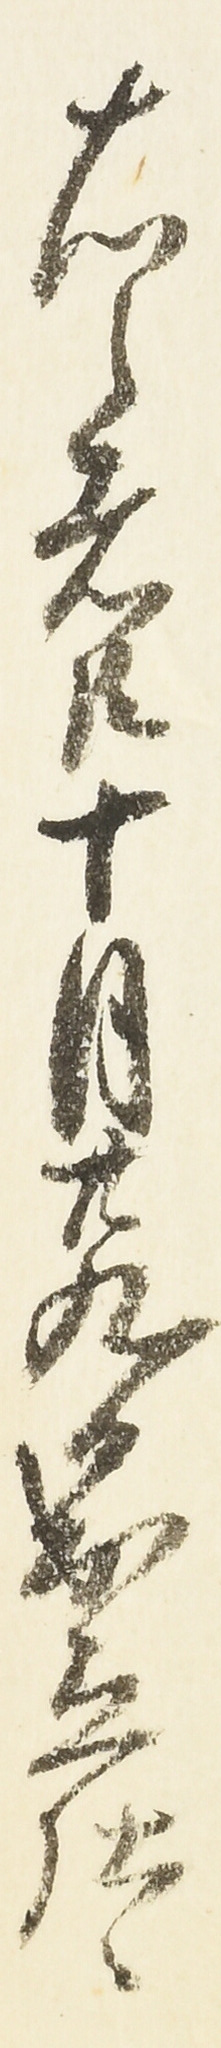右之者共十月廿九日出立仕候
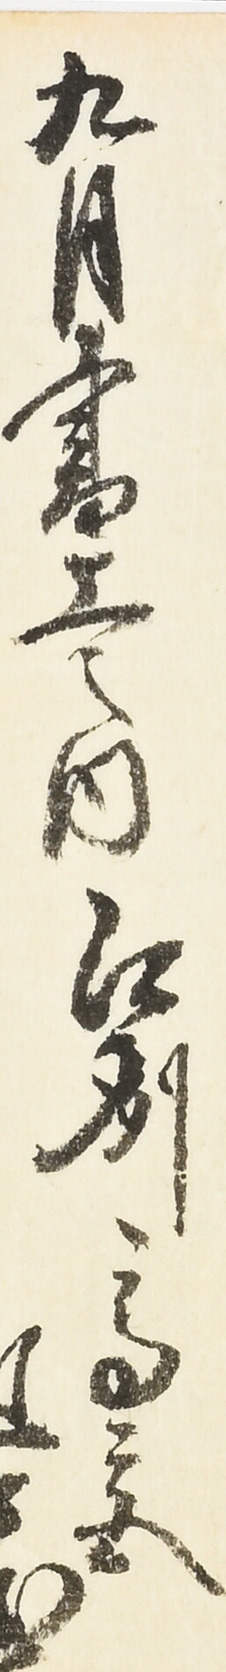九月書上之内江州高宮
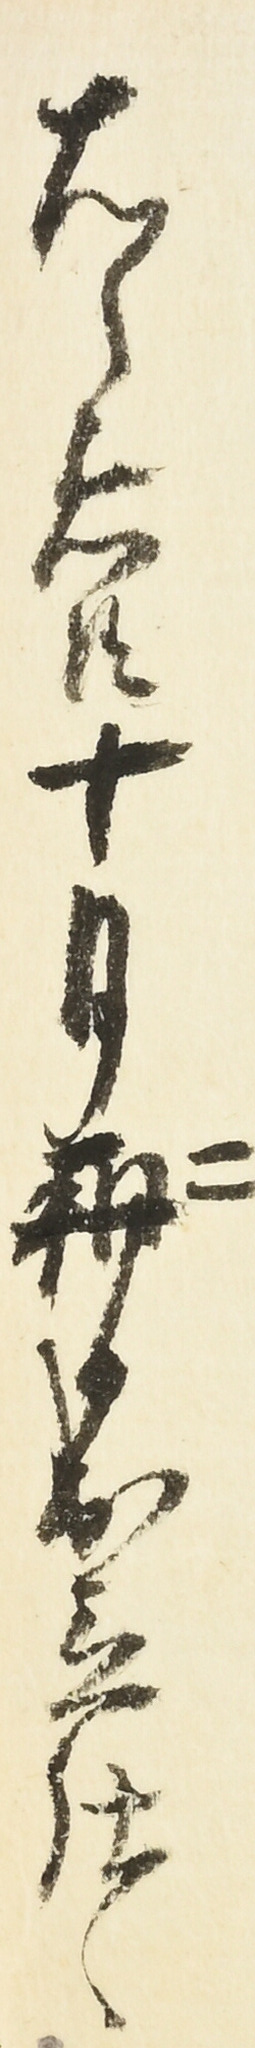右之者共十月廿九日出立仕候

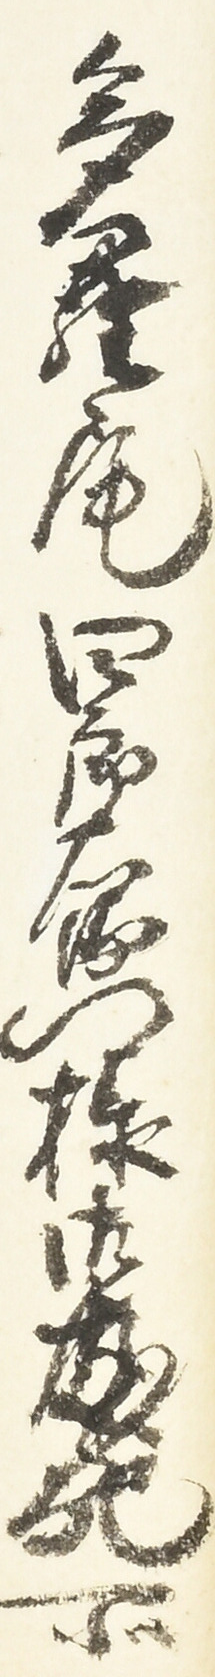多羅尾四郎右衛門様御支配所
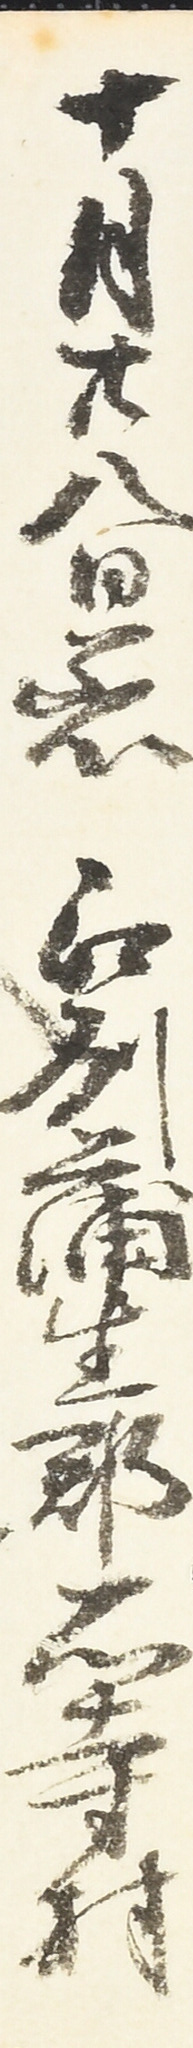十月廿八日着江州蒲生郡石寺村
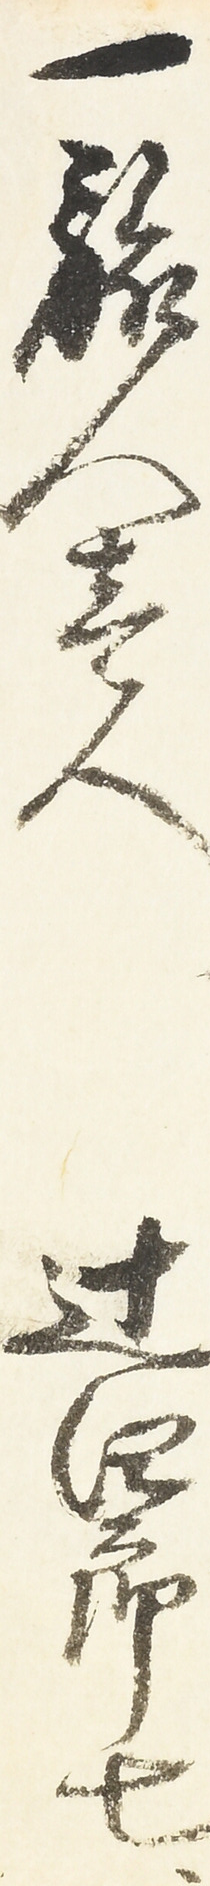一旅人壱人辻四郎七・
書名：町中旅人泊控帳
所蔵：伊那市立高遠町図書館・合同会社AMANE
